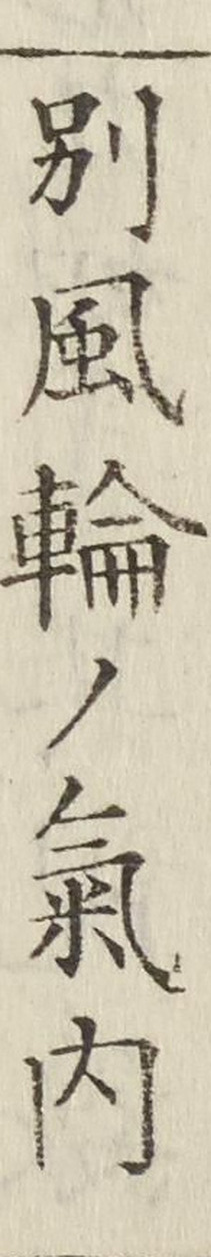別風輪ノ気内
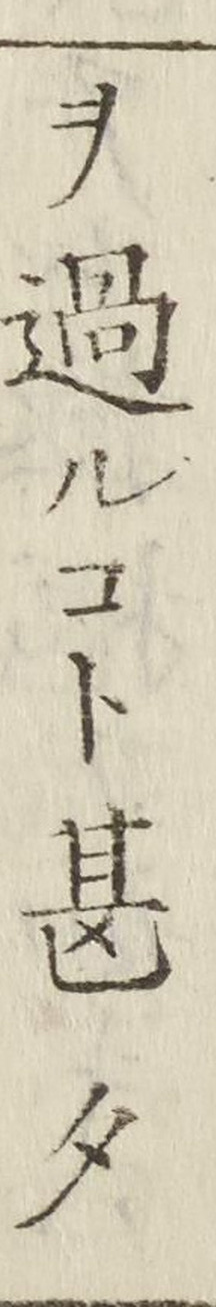ヲ過ルコト甚タ
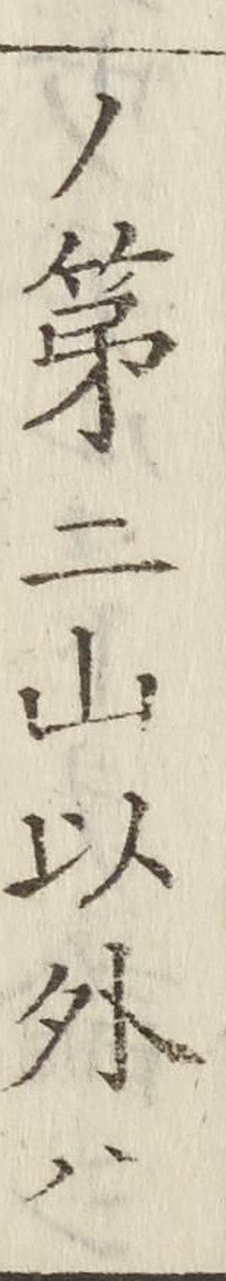ノ第二山以外ハ
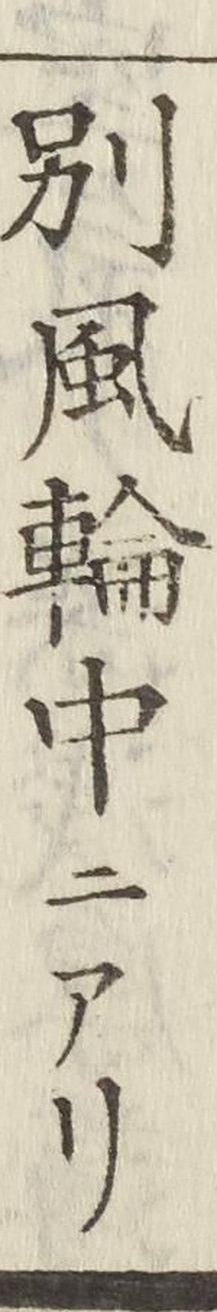別風輪中ニアリ
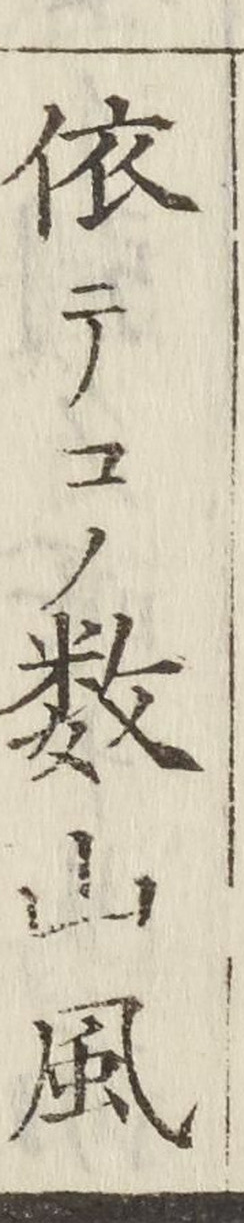依テコノ数山風
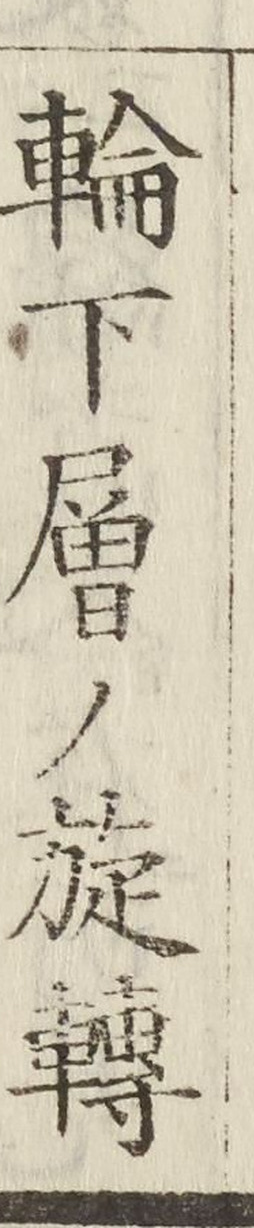輪下層ノ旋転
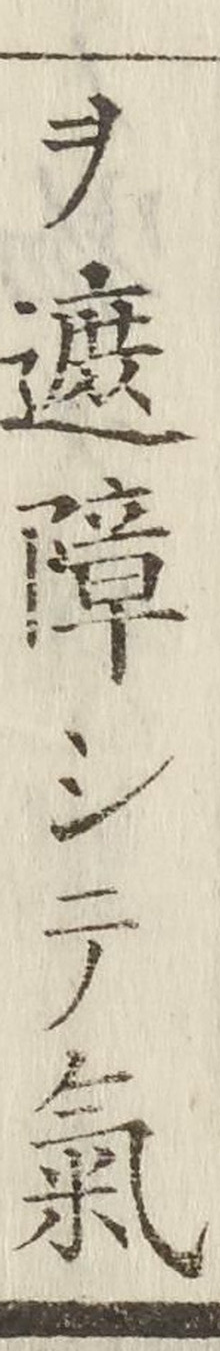ヲ遮障シテ気
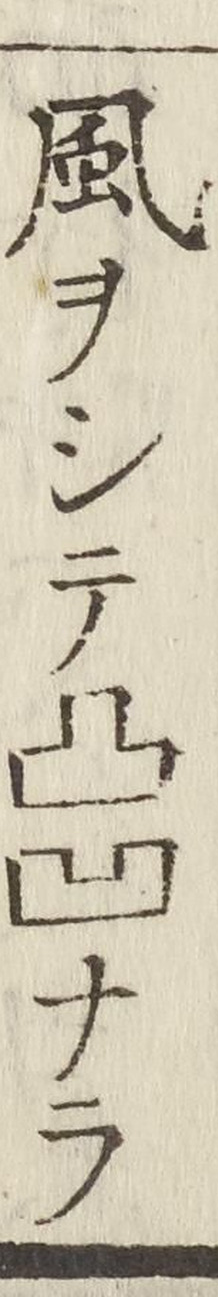風ヲシテ凸凹ナラ
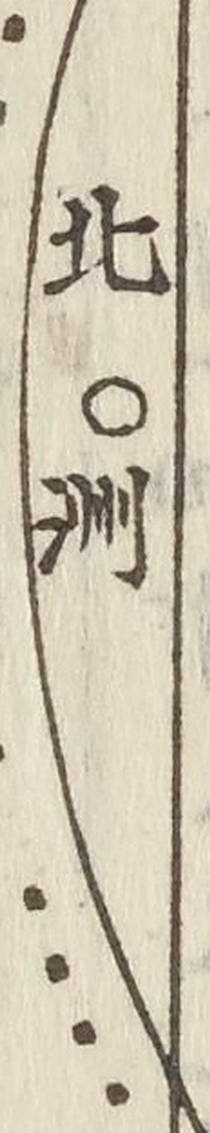北〇洲
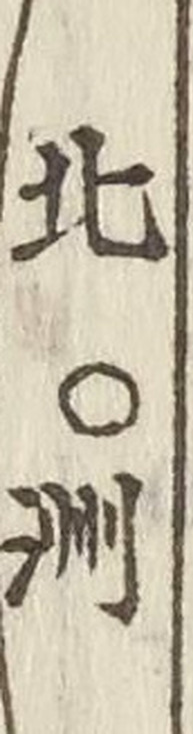北〇洲
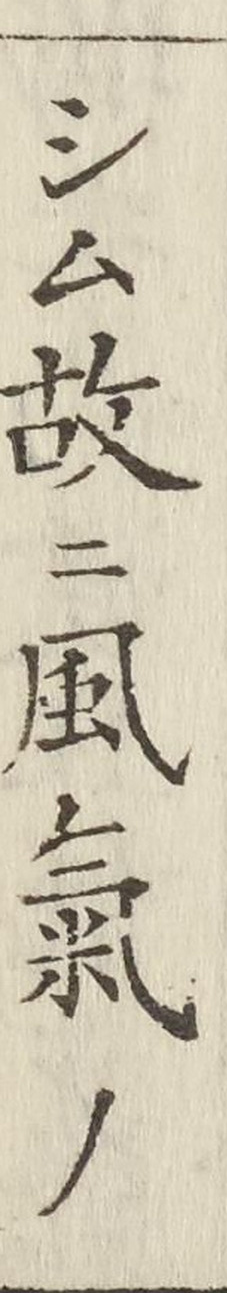シム故ニ風気ノ
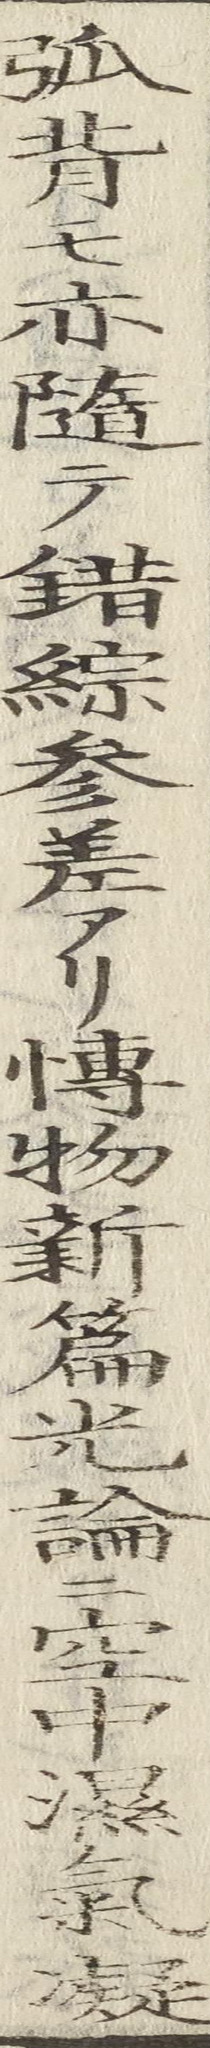弧背モ亦随テ錯綜参差アリ慱物新篇光論ニ空中湿気凝
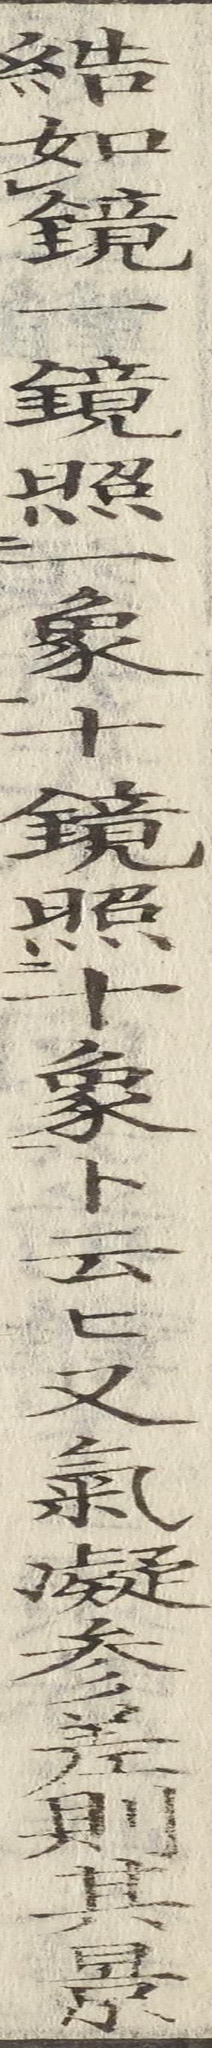結如鏡一鏡照ニ一象十鏡照ニ十象ト云ヒ又気凝参差則其景
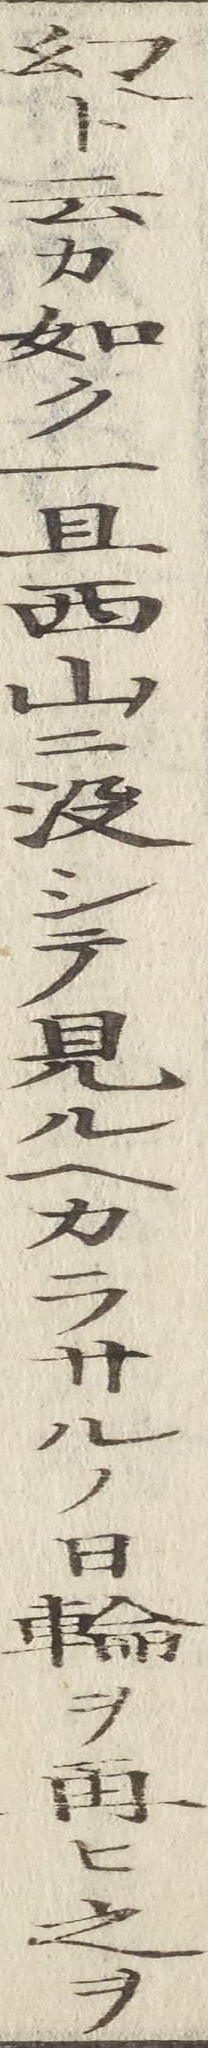幻ト云カ如ク一且西山ニ没シテ見ルヘカラサルノ日輪ヲ用ヒ之ヲ
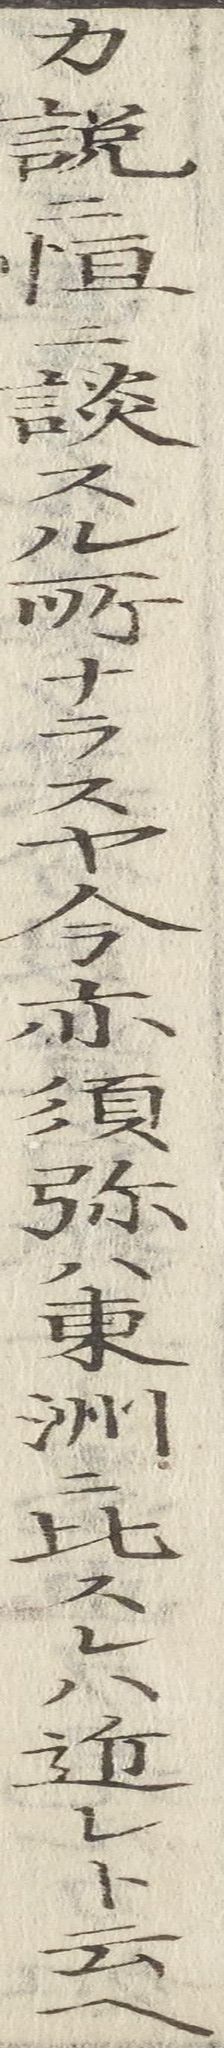カ説ニ恒ニ談スル所ナラスヤ今亦須弥ハ東洲ニ比スレハ近レト云ヘ
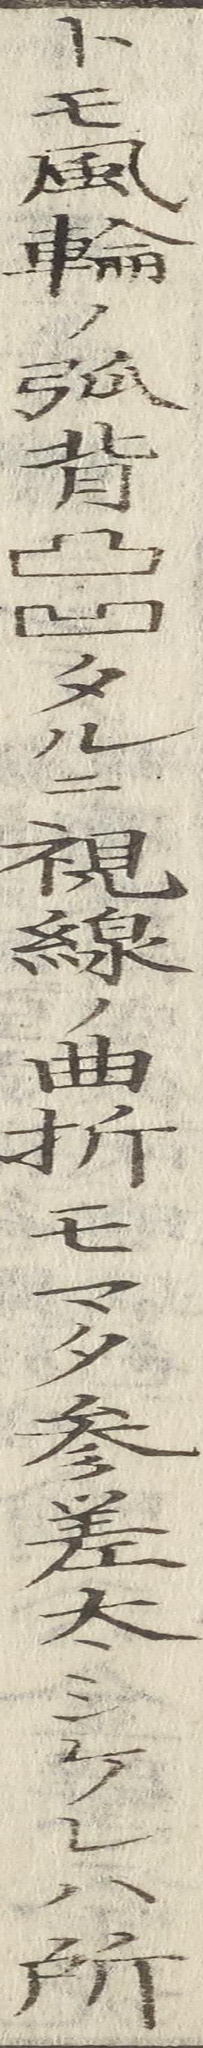トモ風輪ノ弧背凸凹タルニ視線ノ曲折モマタ参差太シケレハ所
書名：護法新論　二編　中
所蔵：東京大学地震研究所図書室 Earthquake Research Institute Library, The University of Tokyo, JAPAN
